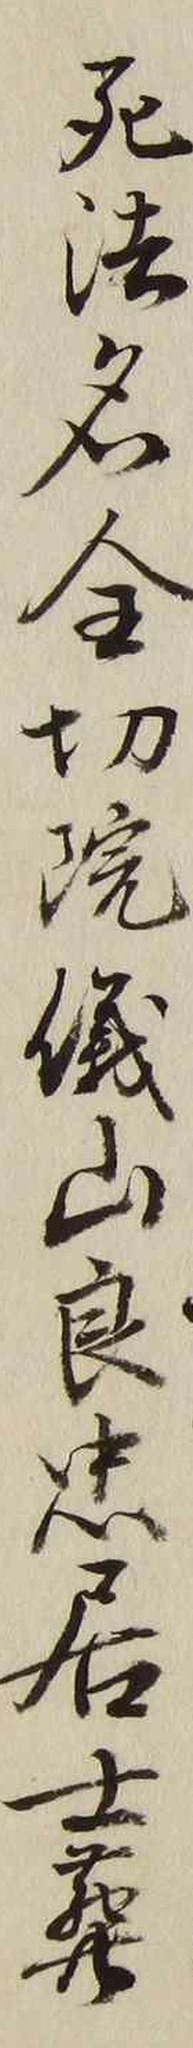死法名全切院儀山良忠居士葬

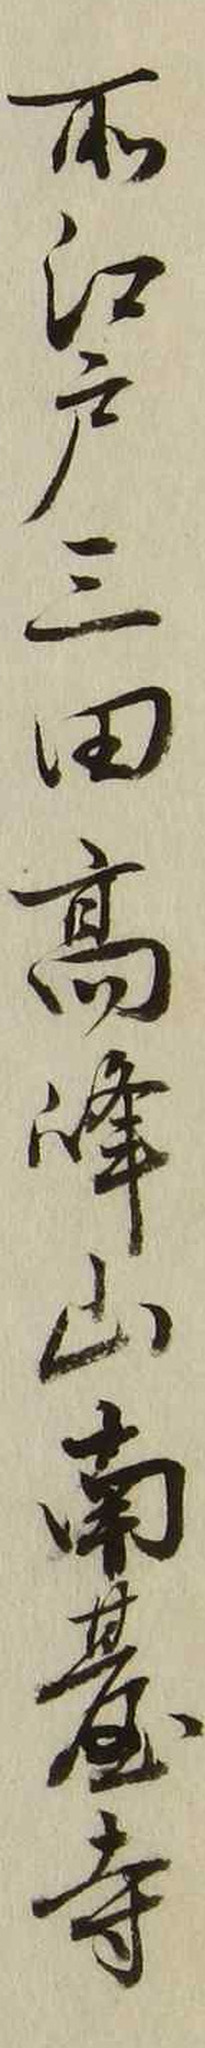所江戸三田高峰山南台寺
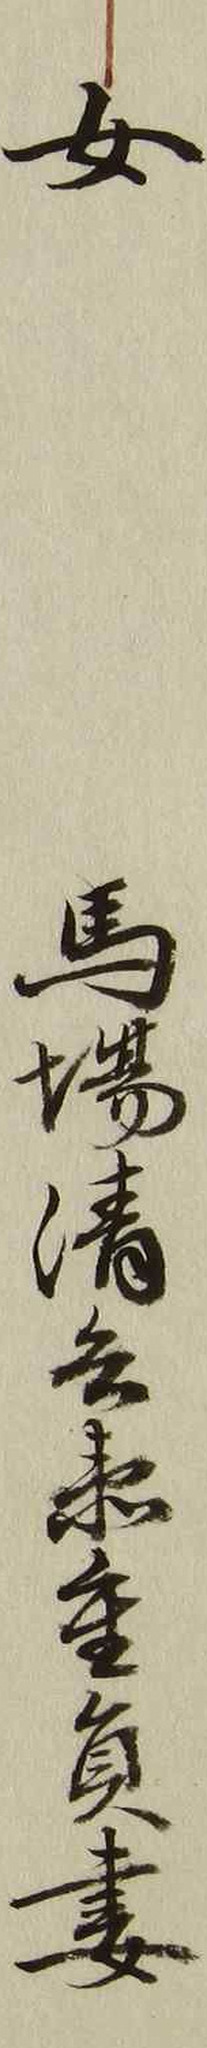女馬場清兵衛重員妻
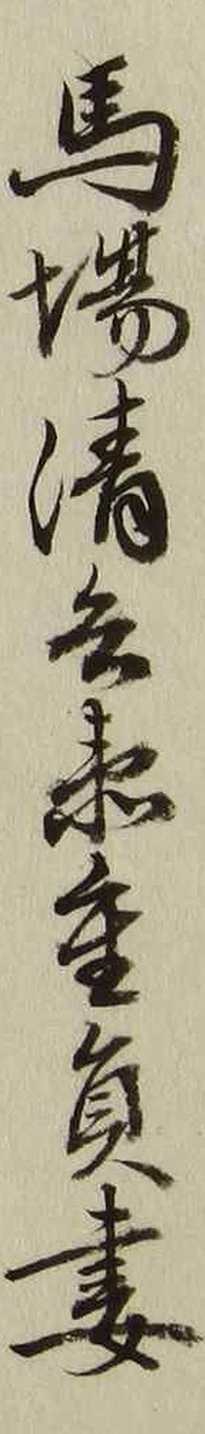女馬場清兵衛重員妻
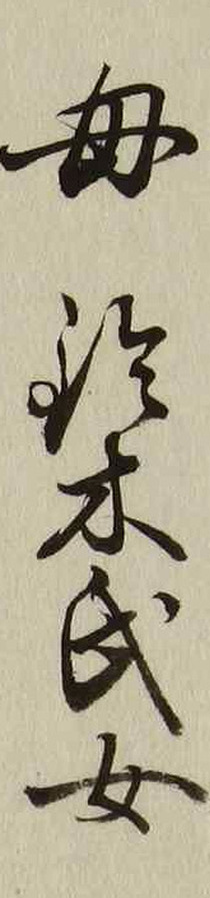母鈴木氏女
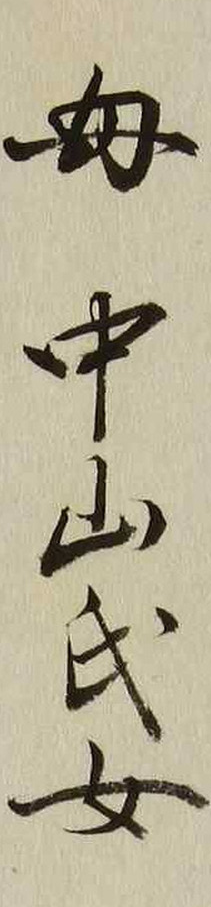母中山氏女
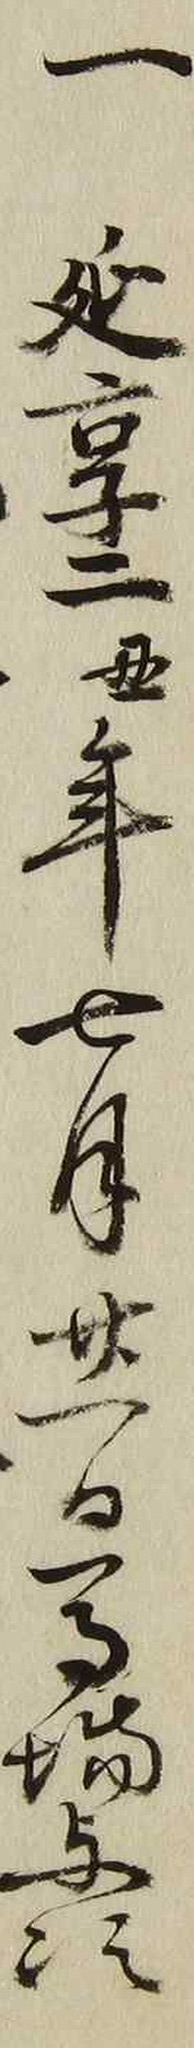一延享二丑年七月廿一日馬場与次
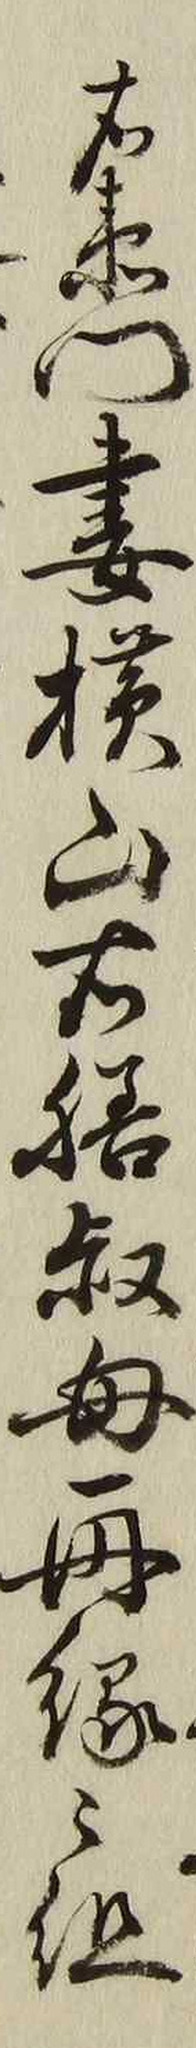右衛門妻横山右膳叔母再縁々組
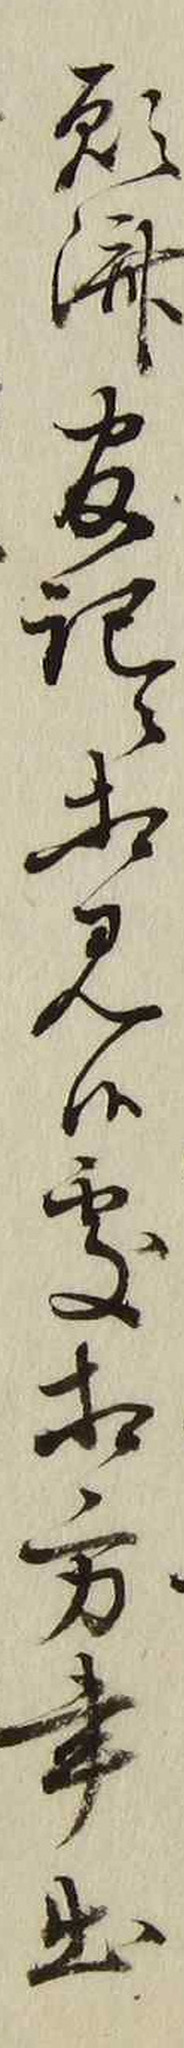願済官記ニ相見候処相方書出
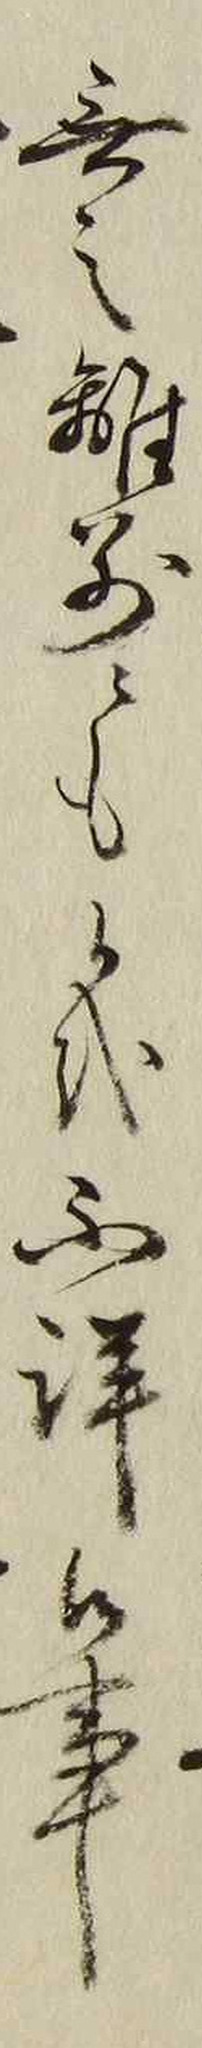無之離別ニも候哉不詳候事
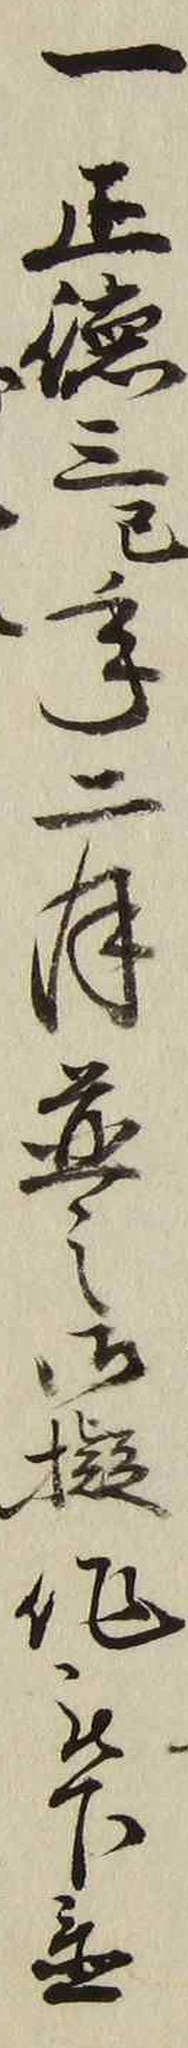一正徳三巳年二月並之御擬作被下置
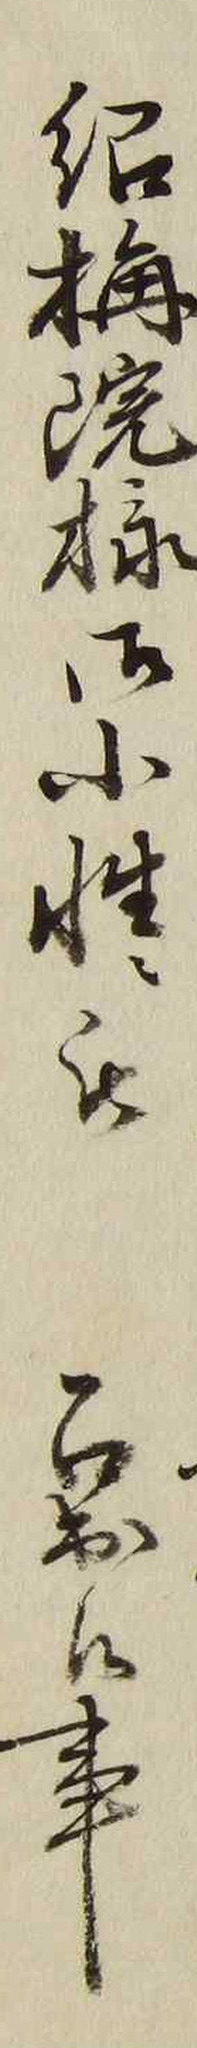紹栴院様御小性ニ被召出候事

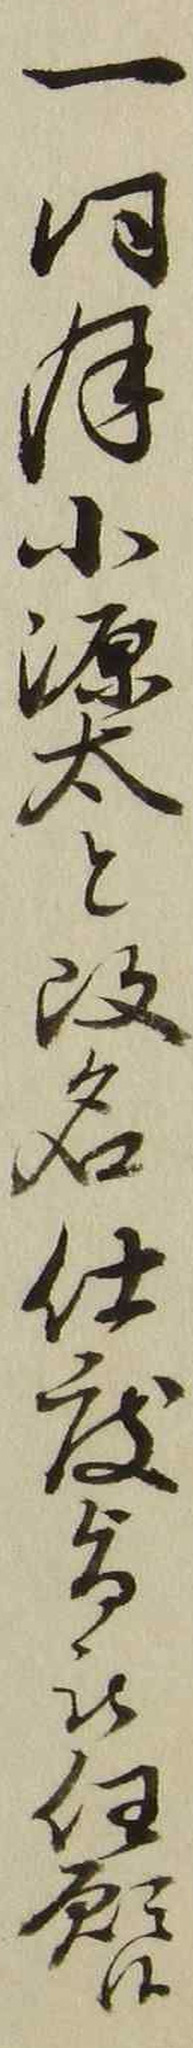一同月小源太と改名仕度旨被任願候
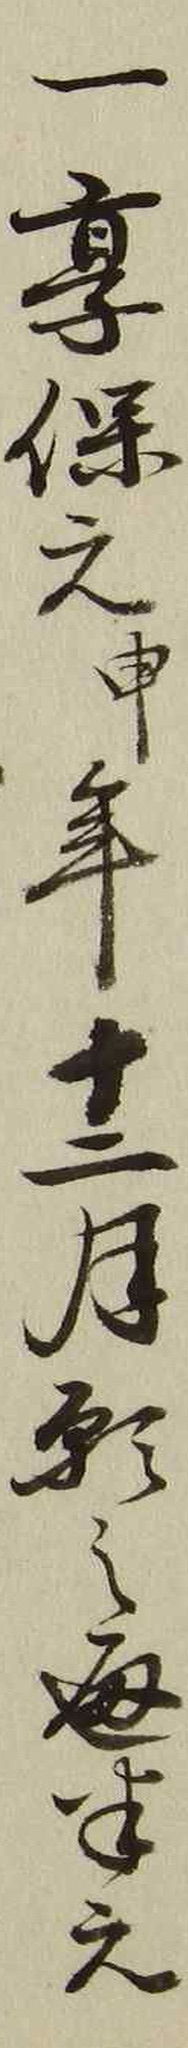一享保元申年十二月願之通半元
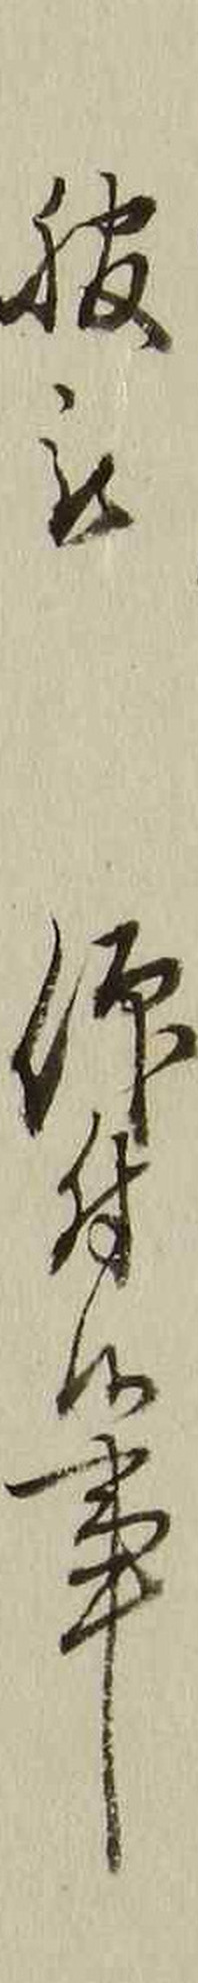服被仰付候事
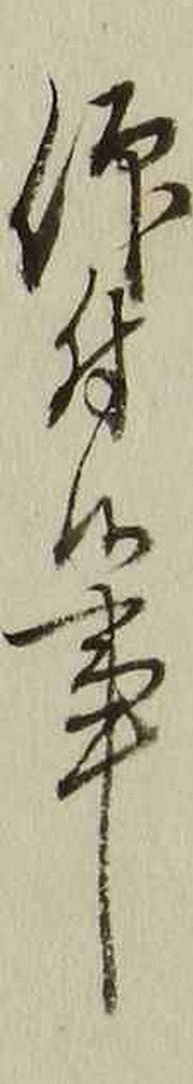仰付候事
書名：諸士系譜　巻之35　は之部3
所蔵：会津若松市立会津図書館
